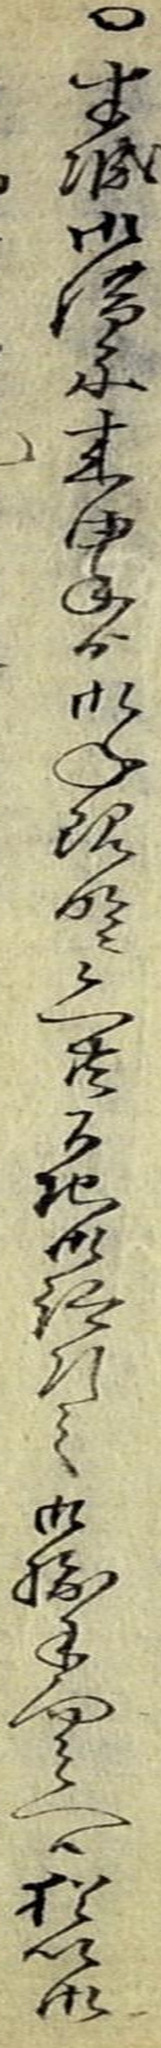○半減御借米来丑年ゟ御年限明に候へ共下地御跡引之御勝手向に候へは猶以御
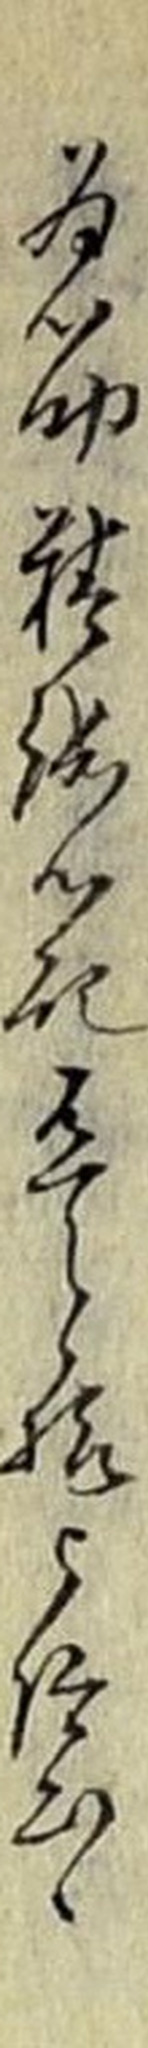為筋精誠心配有之候様被仰出候
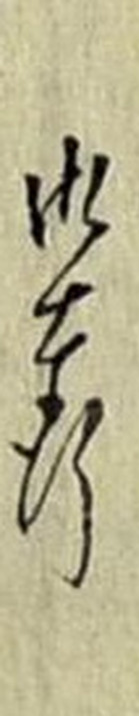御奉行
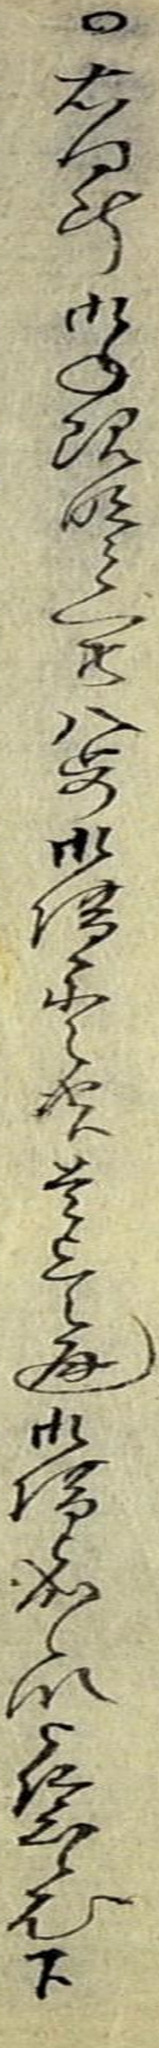○右同断御年限明に候へ共八歩御借米之儀は是迄之通御借被成候段被仰出候尤下
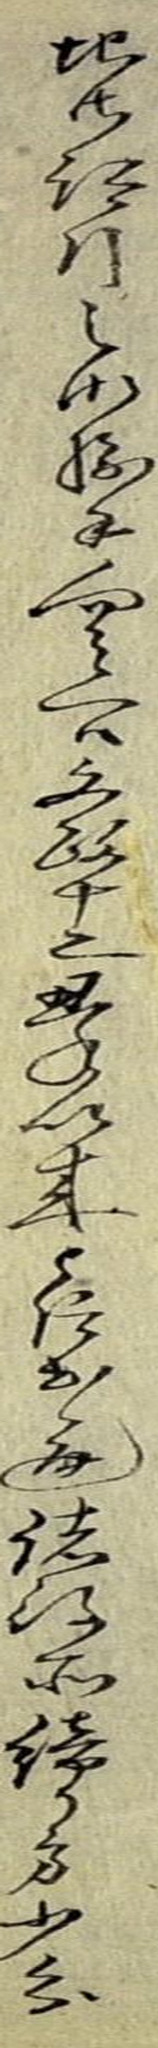地御跡引之御勝手向に候へは文政十二丑年以来被仰出候通諸役所締り方少分
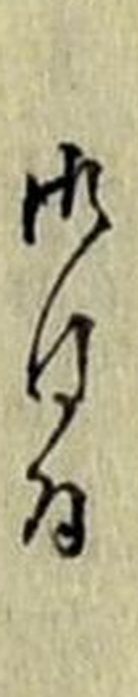御目付
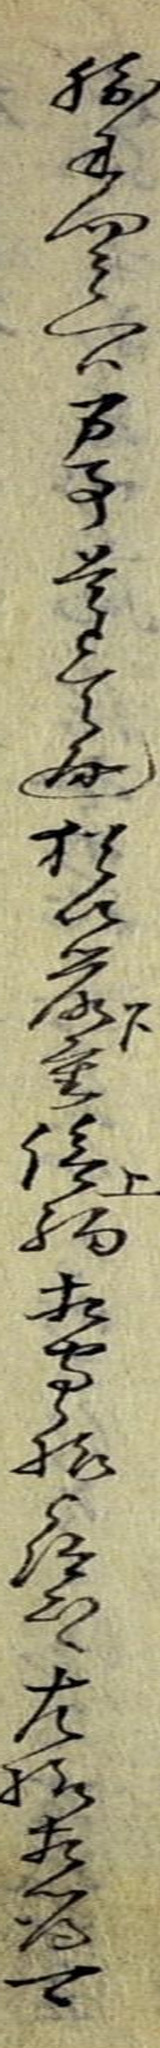地御跡引之御勝手向に候へは万事是迄之通猶以厳重倹約相守候様被出候左様相心得可
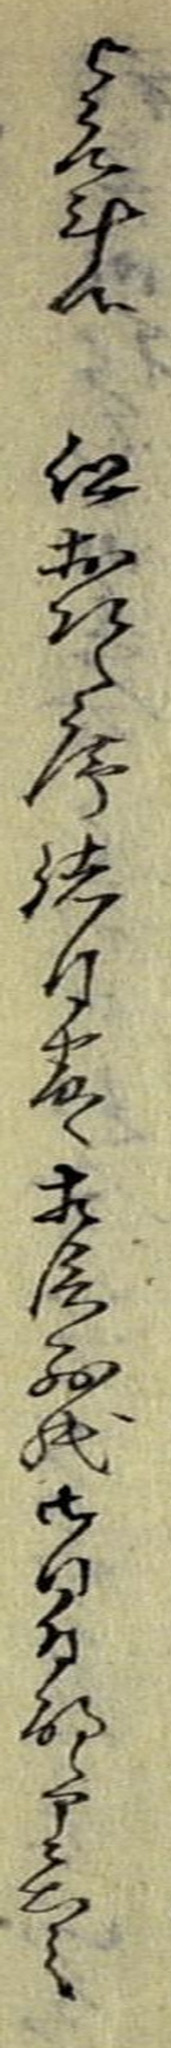被取斗候但於次之席諸月番へ相渡別紙御目付触之部に出之
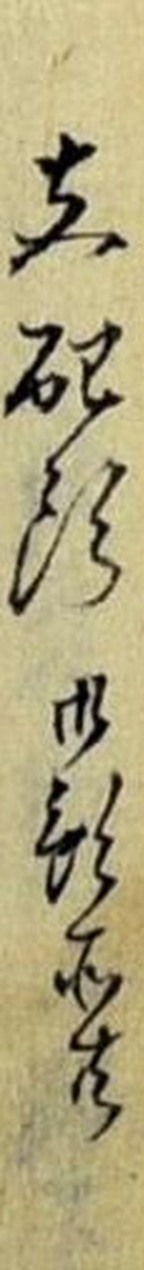支配領御預所共
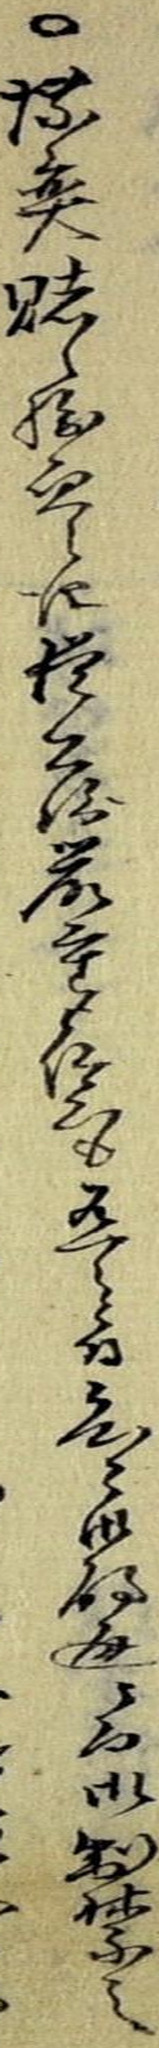○博奕賭之勝負之儀従公儀厳重被仰出も有之に付度々御触通に而御制禁之
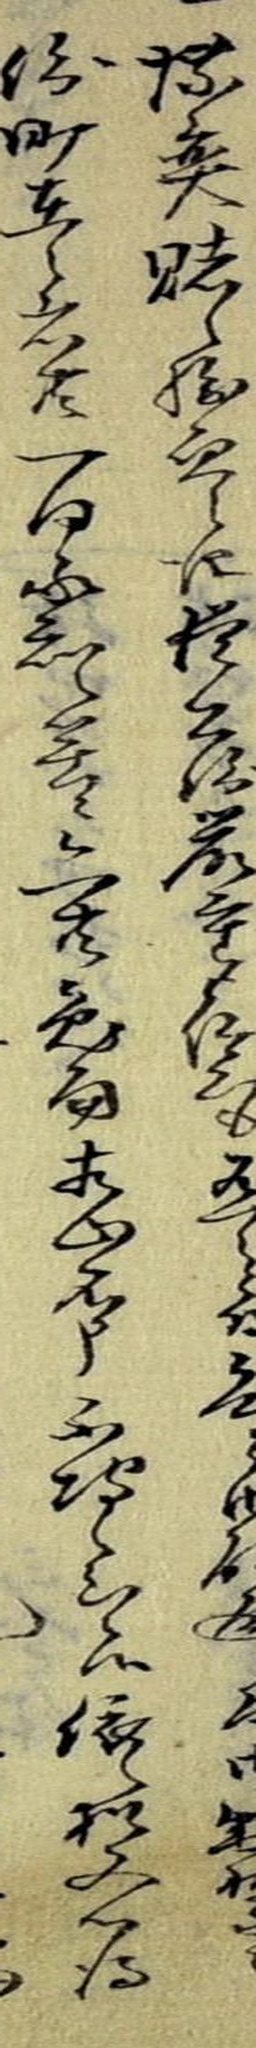儀町在之者共一同承知之筈に候へ共兎角相止不申不埒之至に候依之猶又心得
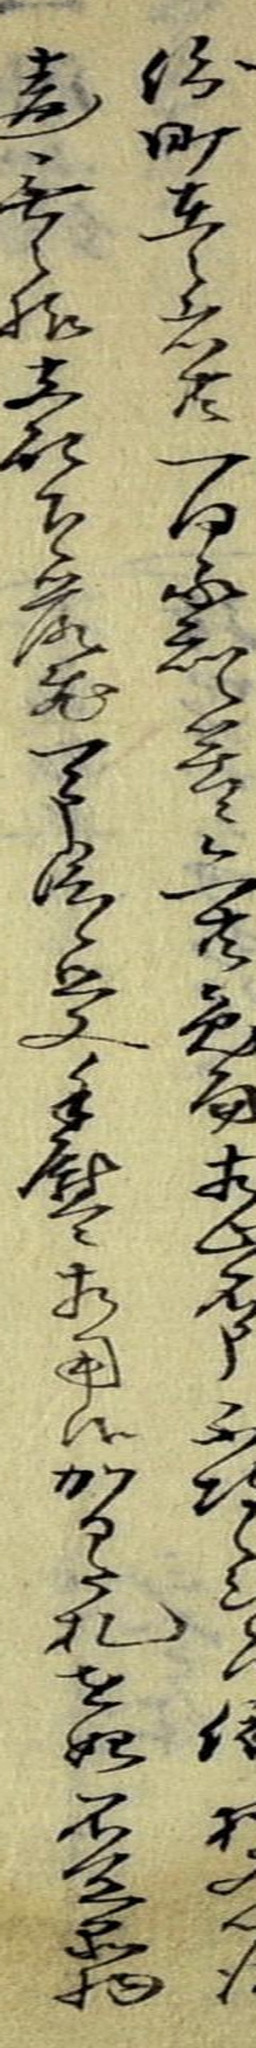違無之様支配下々厳敷可申渡候且又手慰に相用候かるた札を始不宜品物
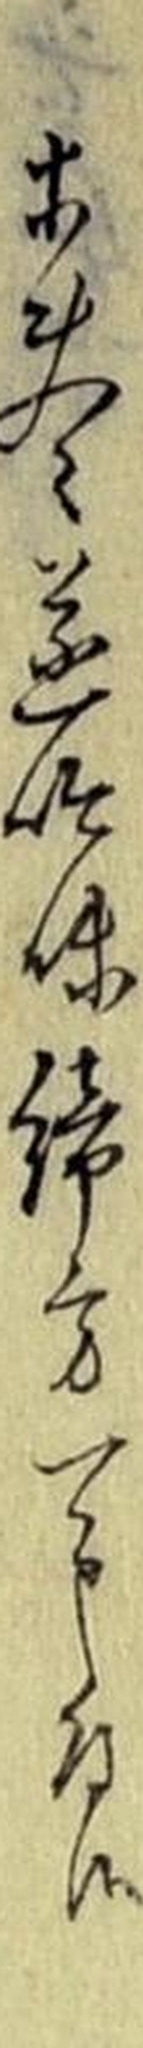等夫々遂吟味締方可申付候
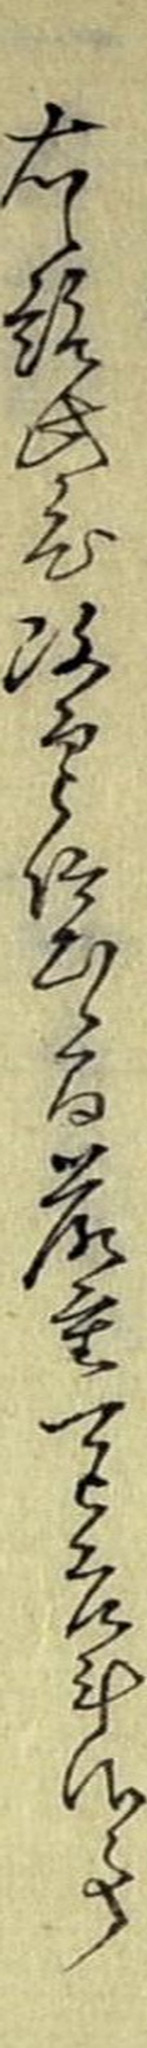右之趣此度改而被仰出候間厳重可被取斗候事
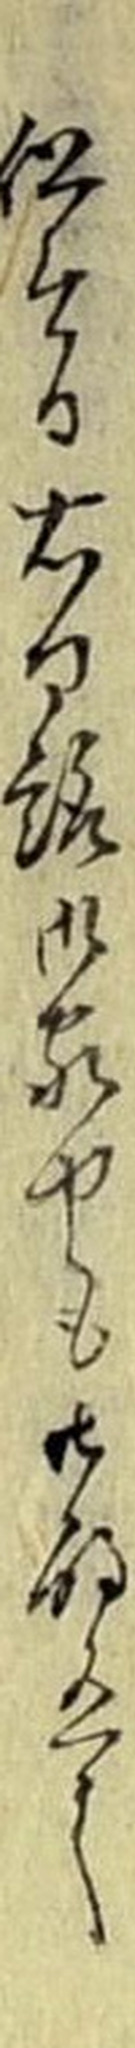但今日右同趣御家中へも御触有之

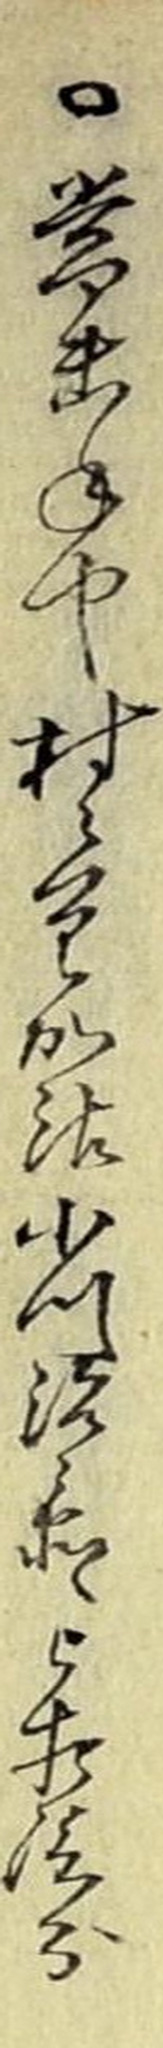○当未年中村々冥加銀小川治兵衛へ被渡分
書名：命令之部 六
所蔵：福井県文書館 Fukui Prefectural Archives
